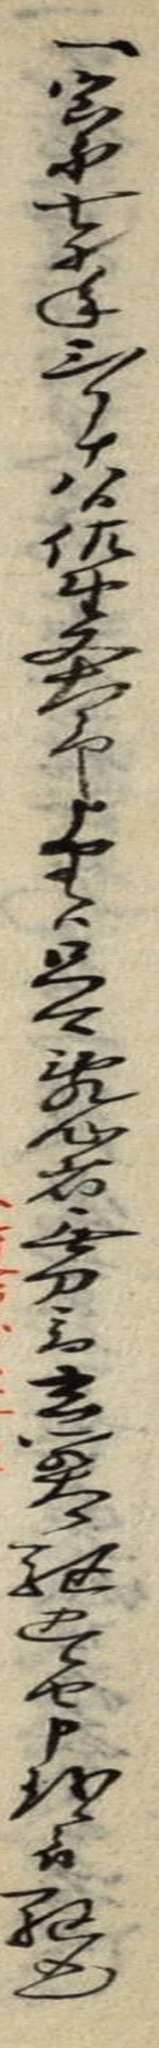一宝永七刁年三月十八日佐野又太郎申聞候は只今乱心者無刀にて玄関へ駆込候由申越候に付駆込
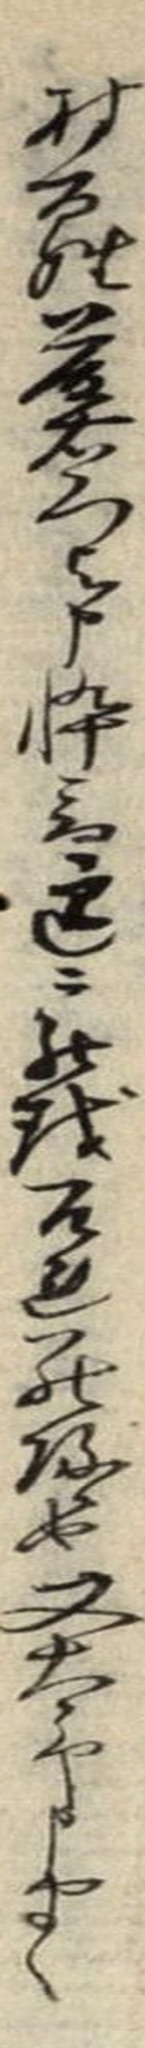村百姓藤右衛門と申悴にて迎に罷越召連罷帰候由又太郎申聞之
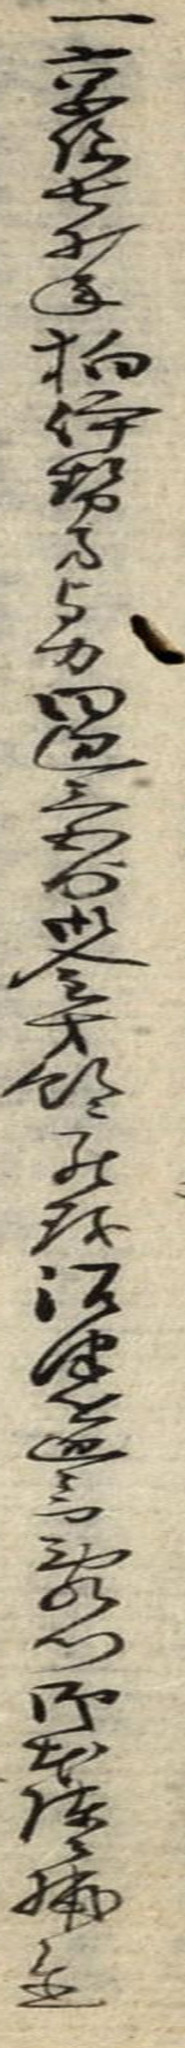一享保七刁年狛伊勢方与力田辺三五右衛門御金才領に罷越沼津近辺にて乱心御本陣に捕置
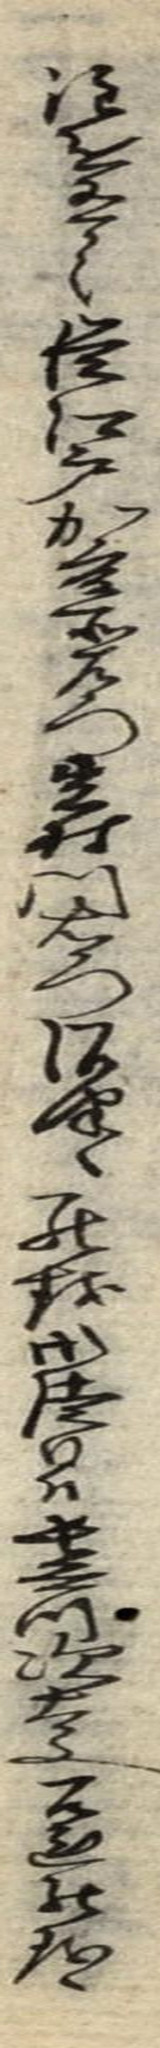注進有之従江戸加藤所左衛門野村門右衛門沼津へ罷越御徒目付長谷川次大夫召連罷越候
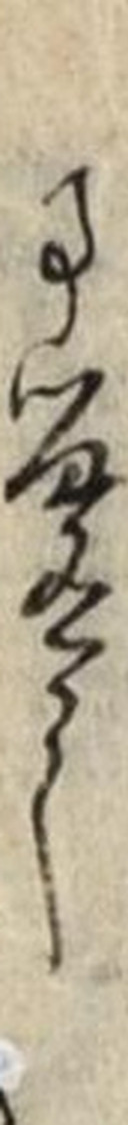事留有之
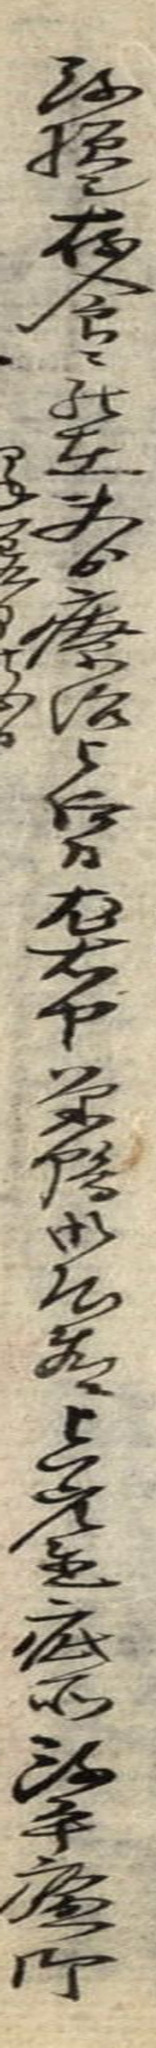致損シ存命に罷在夫ゟ療治被仰付尤右中巣鴨御屋敷に被差置疵所致平癒御
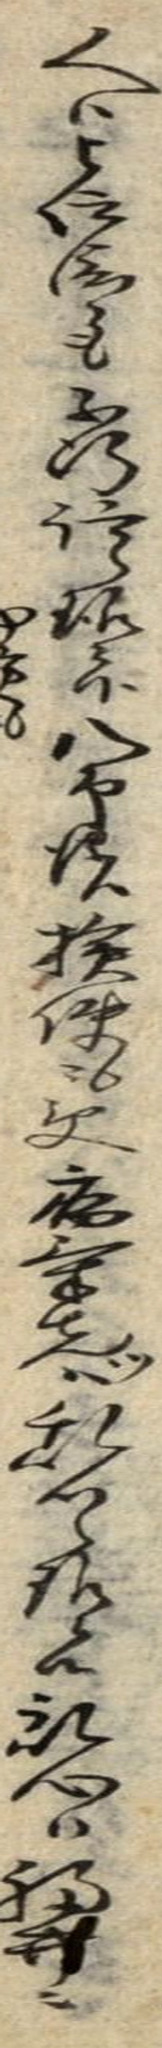人は被仰渡候も不行跡之趣に候八郎儀は検使も受病気先ツは乱心之趣に候乱心は福井に
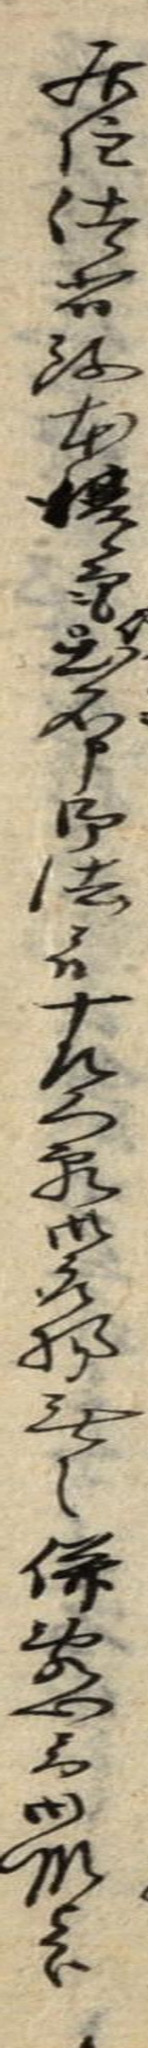居住仕候者致本復候ても◦出不何方へも申御法に付十左衛門願御取揚無之併乱心にて御暇被下

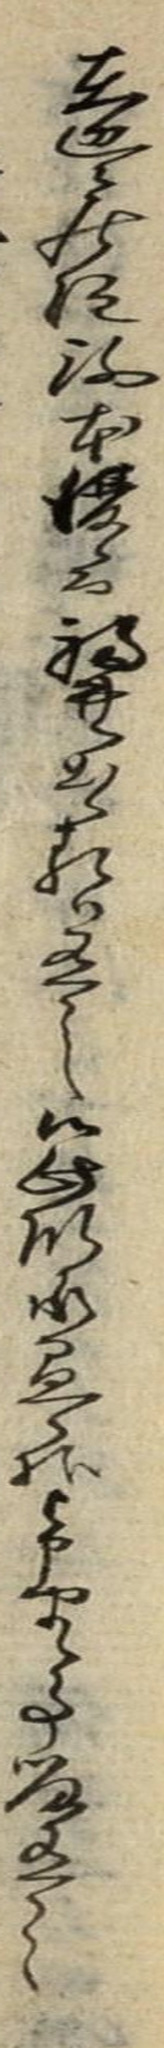在辺に居住致本復候て福井へ出候類は有之候此段承置候様被申聞候事留有之
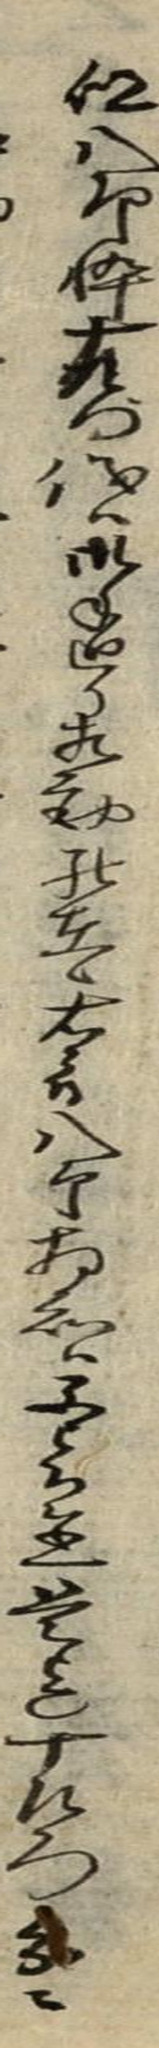但八郎悴十左衛門儀は御手廻り相勤罷在候右に付八郎拝知は不被下置是迄十左衛門分に
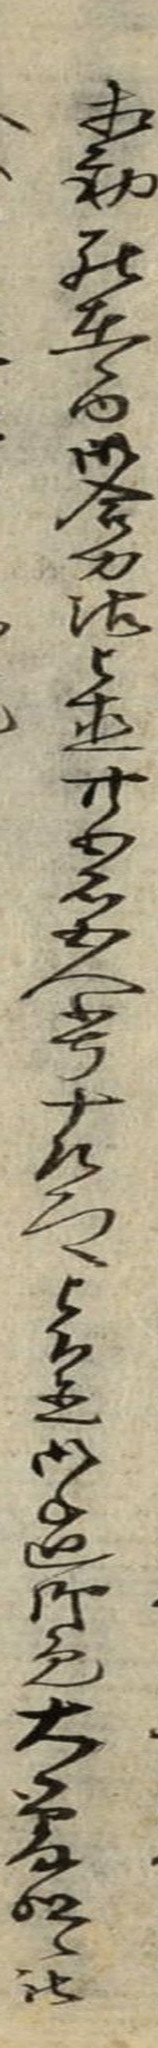相勤罷在候内御合力銀被直廿五石五人ふち十左衛門へ被下置御手廻御免大御番組へ被
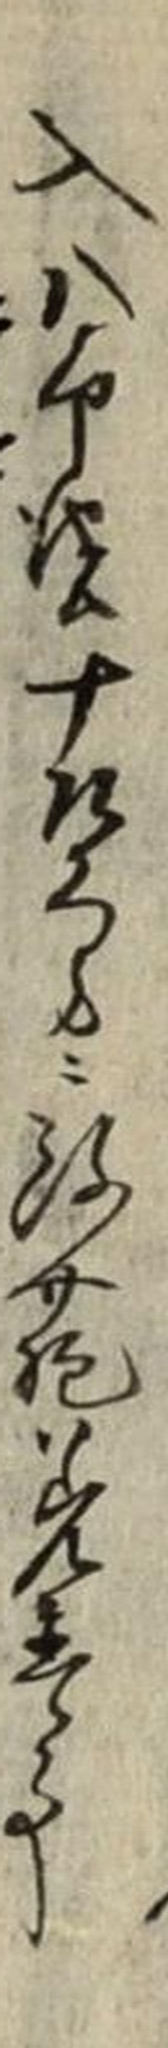入八郎儀は十左衛門方に致介抱差置候事
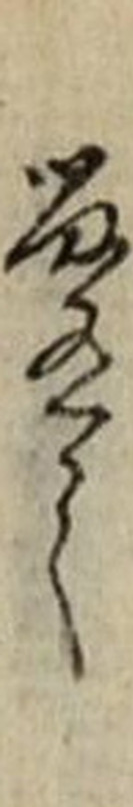留有之
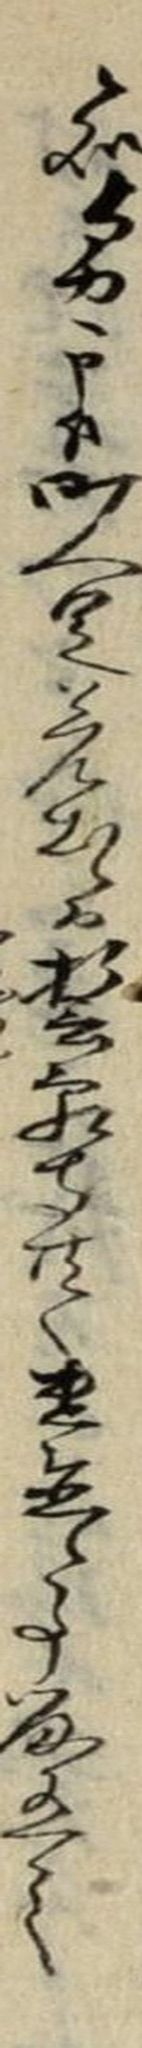候処与力へ申付町人足差出候て誓願寺共へ遣置候事留有之
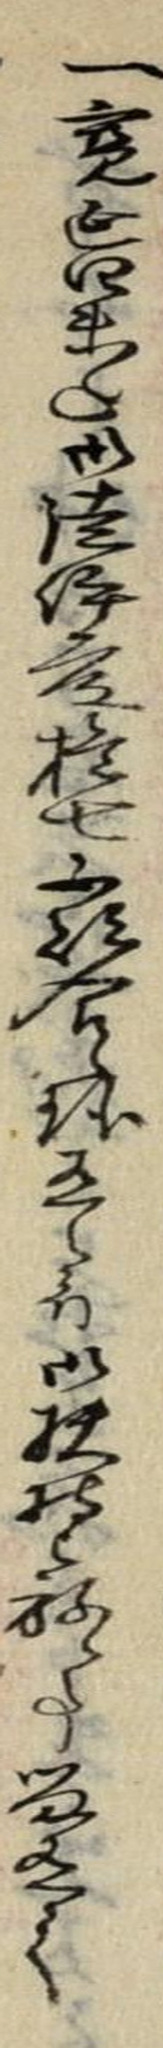一寛延四未年御徒伊藤権七不都合之趣有之に付御扶持被放候事留有之
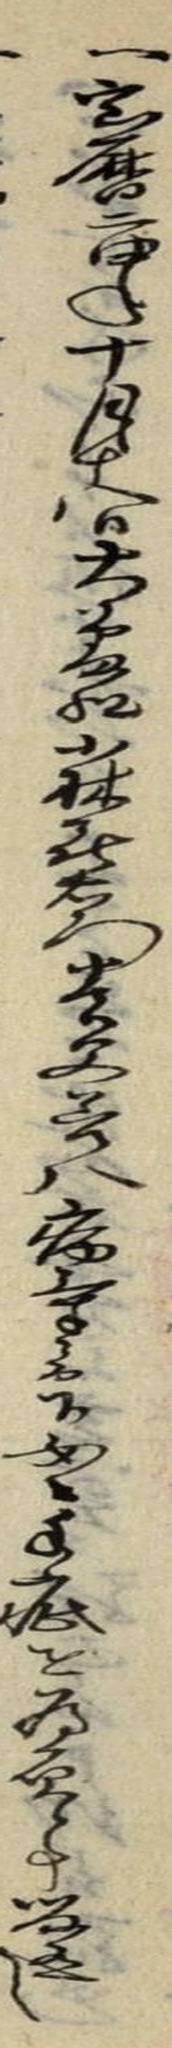一宝暦二申年十月十八日大御番組小林喜右衛門養父善八病気にて下女え手疵を為負候事留有之
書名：御停止異変死失
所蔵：福井県文書館 Fukui Prefectural Archives
